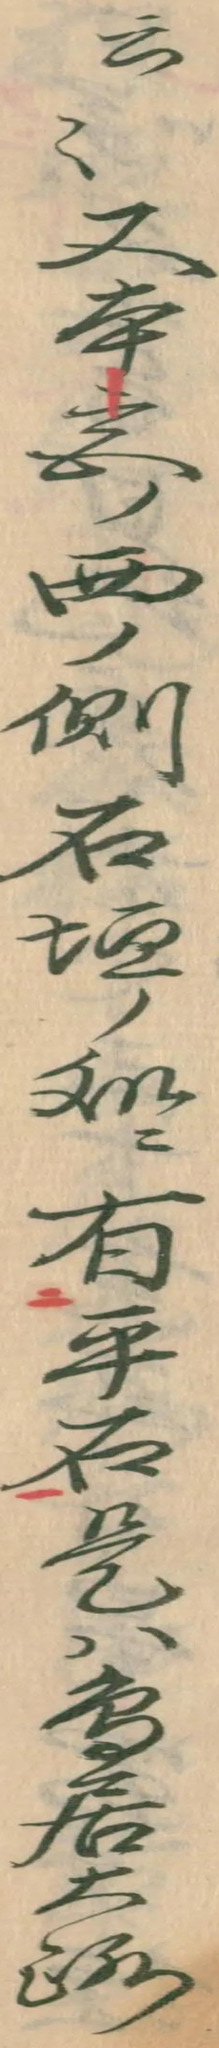云々又本-宮ノ西ノ側石垣ノ処ニ有平石是ハ鳥居大路
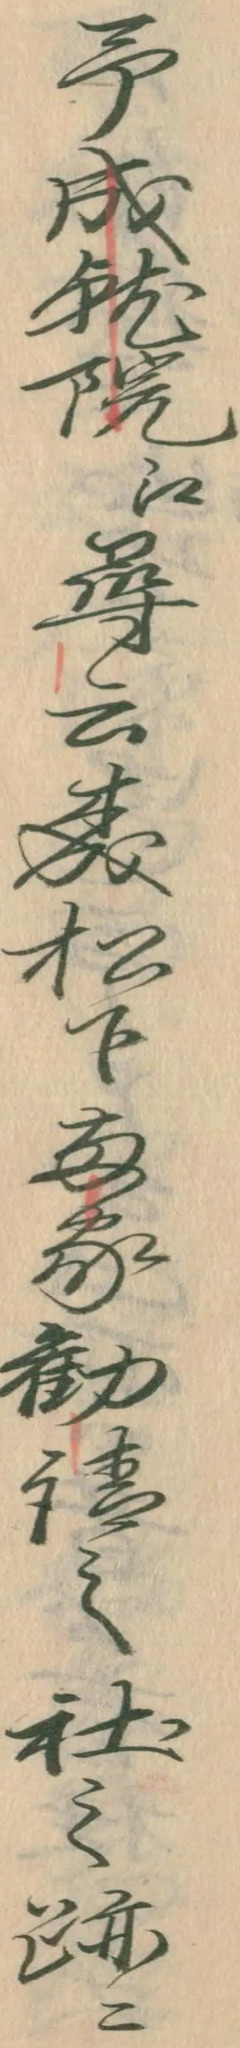予成就院江尋_云森松下両-家勧-請之社之跡ニ

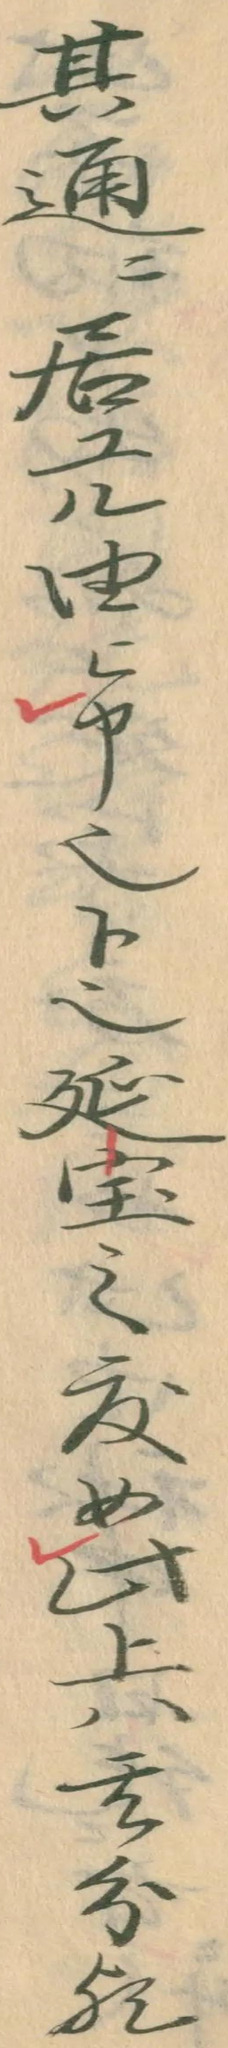其通ニ居ユル由被申也ト也延-宝之度如此上ハ其分歟
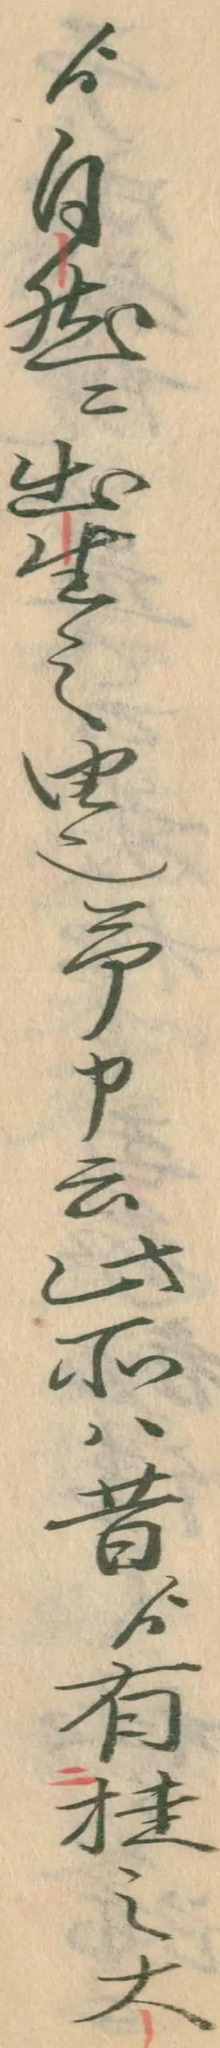ゟ自-然ニ出-生之由也予申云此所ハ昔ゟ有桂之大-
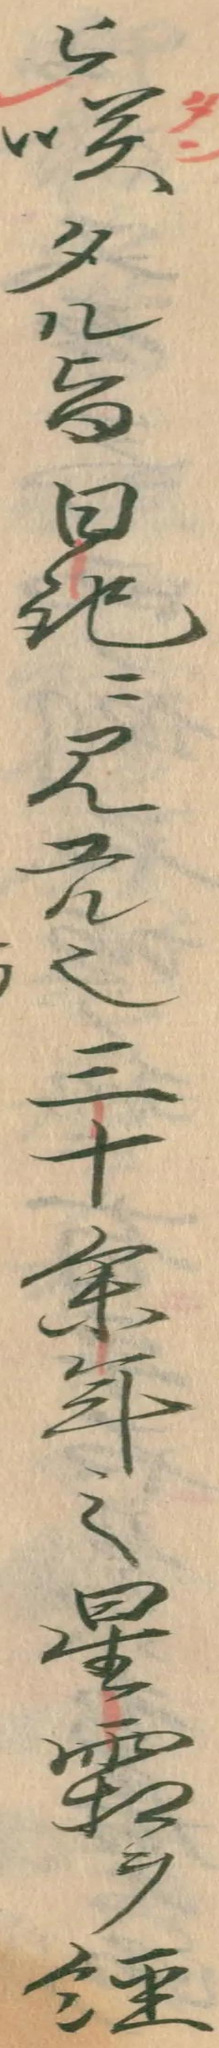被嘆タル旨日-記ニ見ユル也三-十余-年之星-霜ヲ経
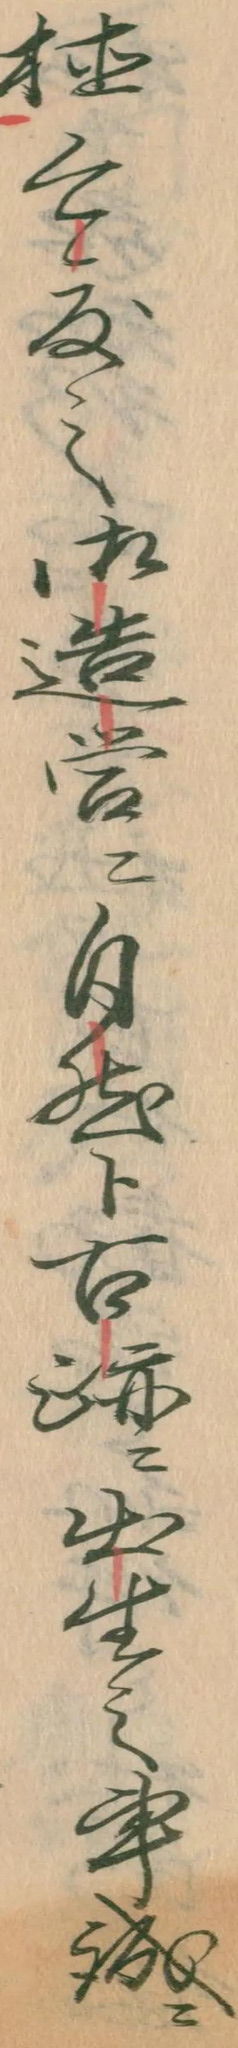植今-度之御-造-営ニ自-然ト古-跡ニ出-生之事誠ニ
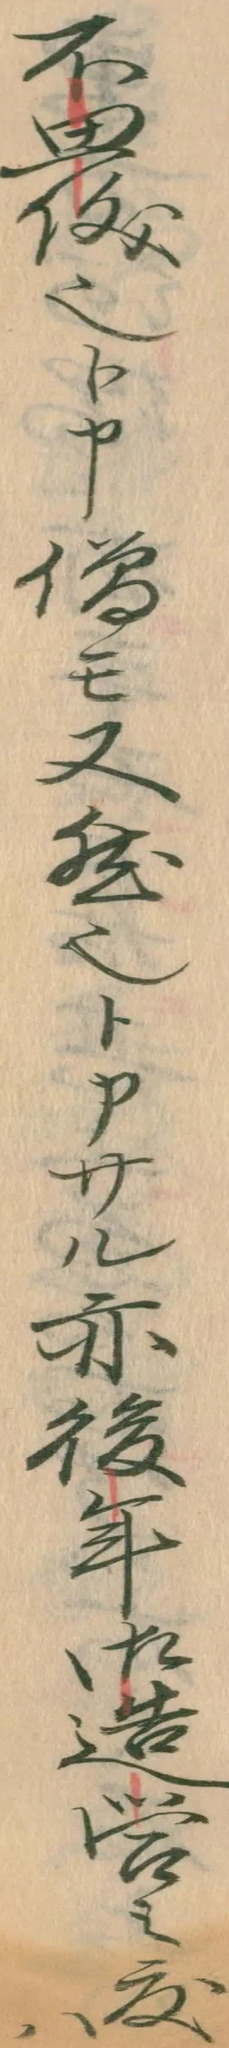不-思-儀也ト申僧モ亦然也ト申サル亦後-年御-造-営之度ハ
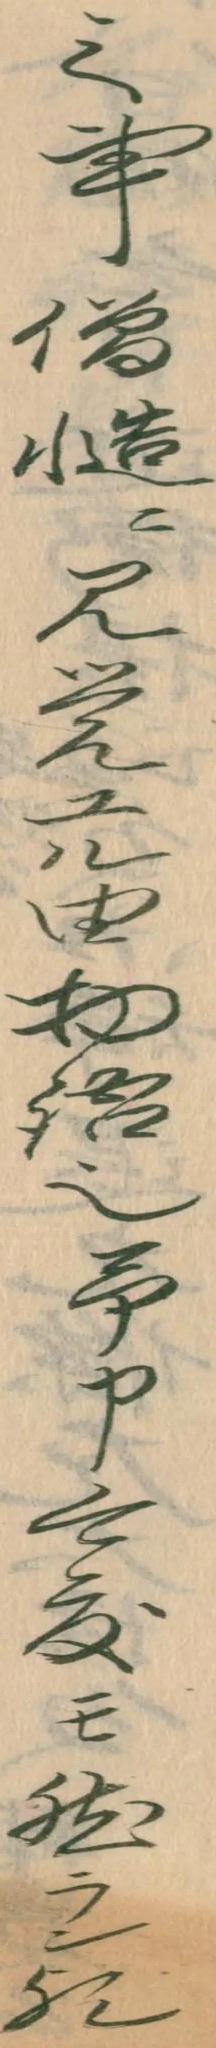之事僧慥二見覚ユル由物語也予申今度モ然ラン歟
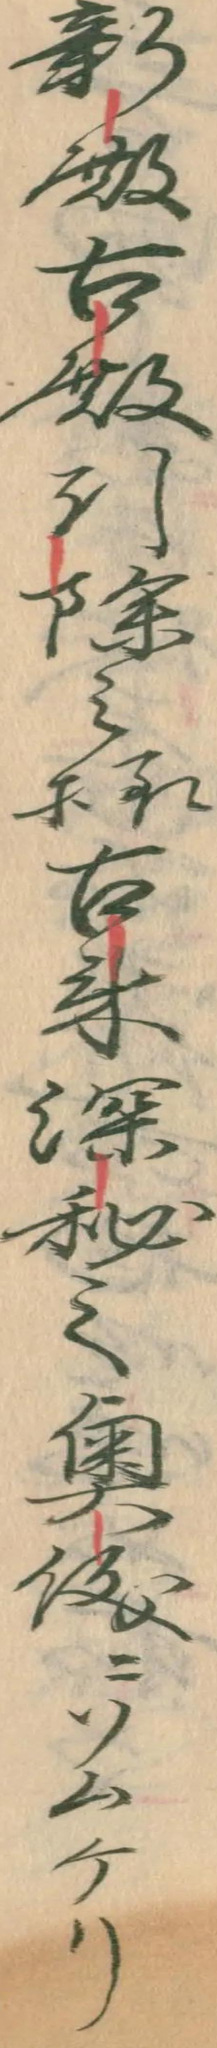新-殿古-殿引_除之様古-来深-秘之奥-儀ニソムケリ
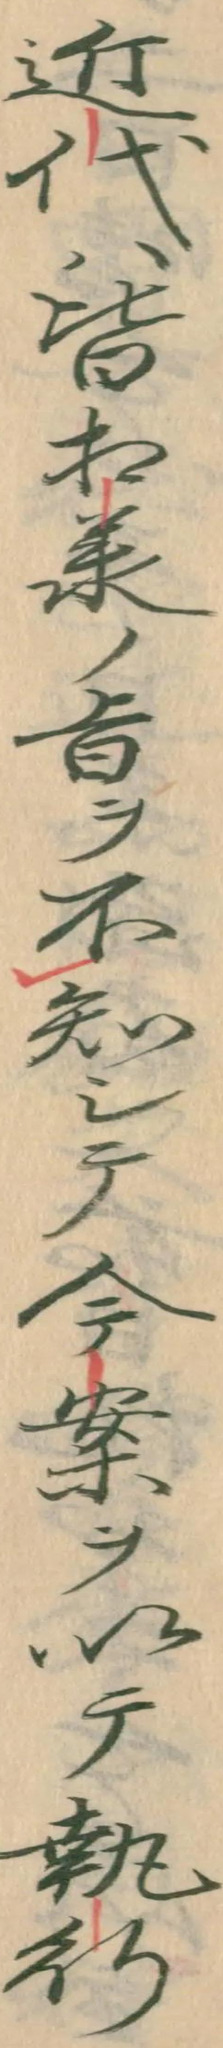近-代ハ皆相-承ノ旨ヲ不知シテ今-案ヲ以テ執-行
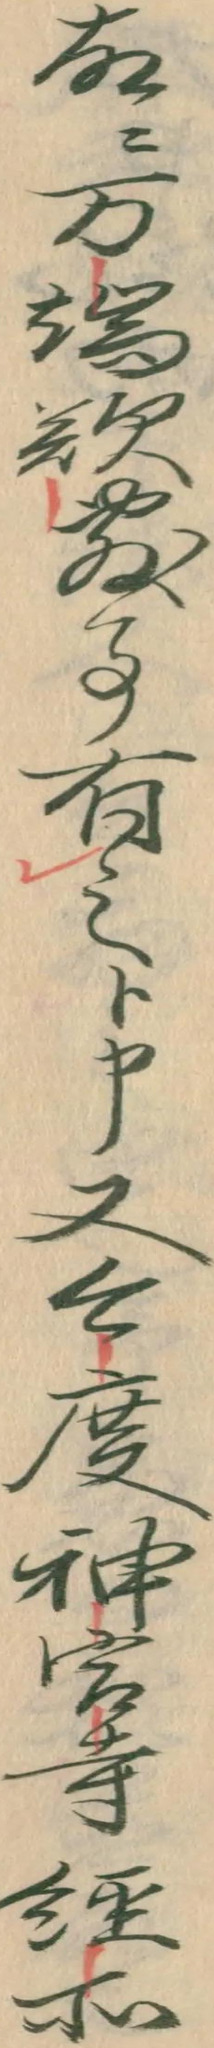故ニ万-端歎-敷事有之ト申又今-度神-宮-寺経-所
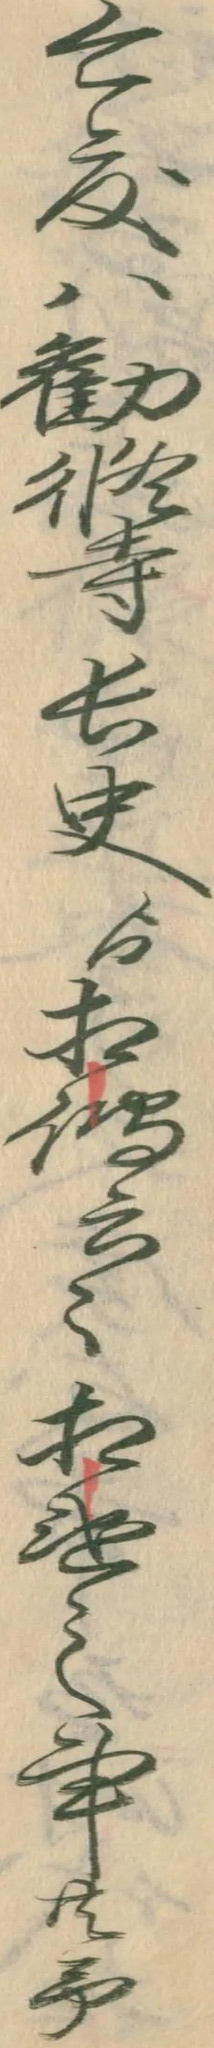今度ハ勧修寺長史ゟ相-伝云々相-違之事共予

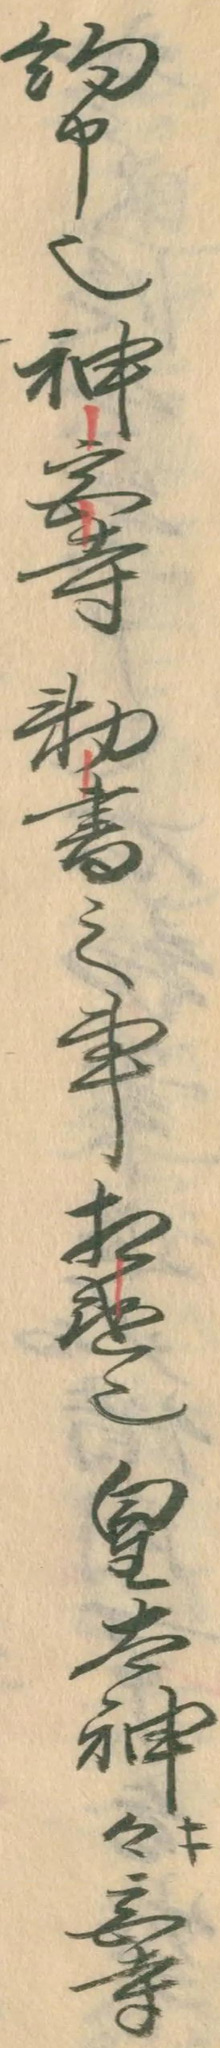約申也神-宮-寺勅-書之事相-違也皇太神々宮寺
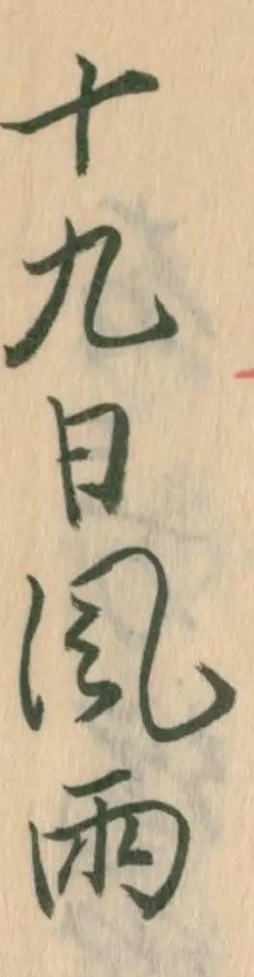十九日風雨
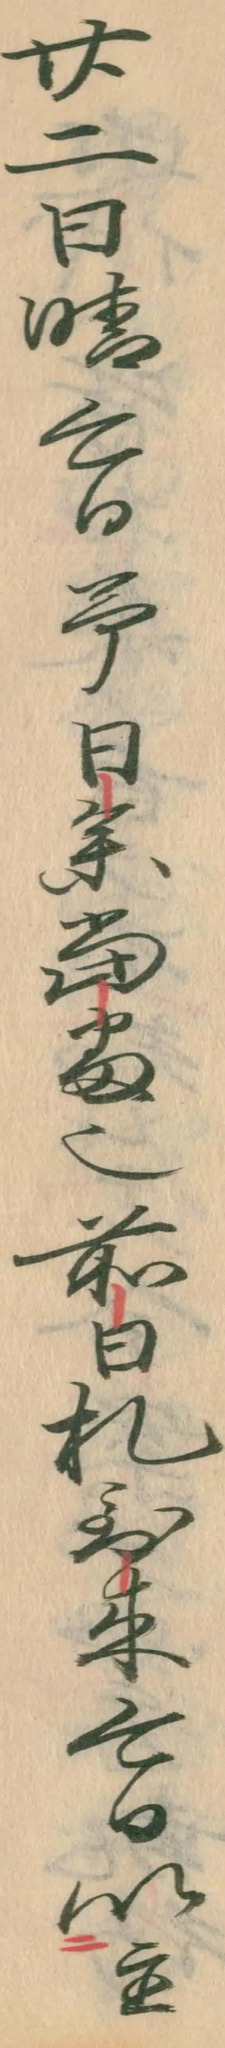廿二日晴今日予日-参当-番也前-日札到-来今日以主
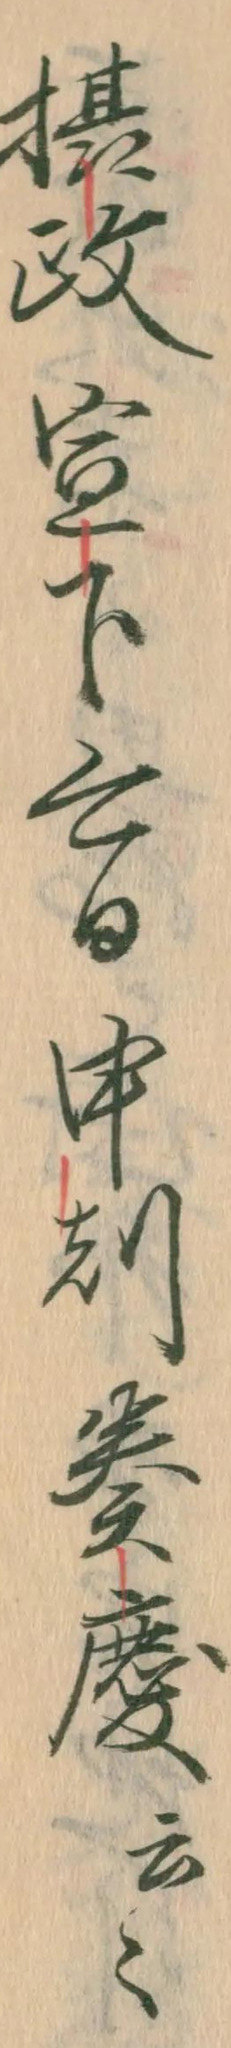摂-政宣-下今日申_刻奏-慶云々
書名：賀茂社記録. 第16冊
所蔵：国立国会図書館 National Diet Library, JAPAN
